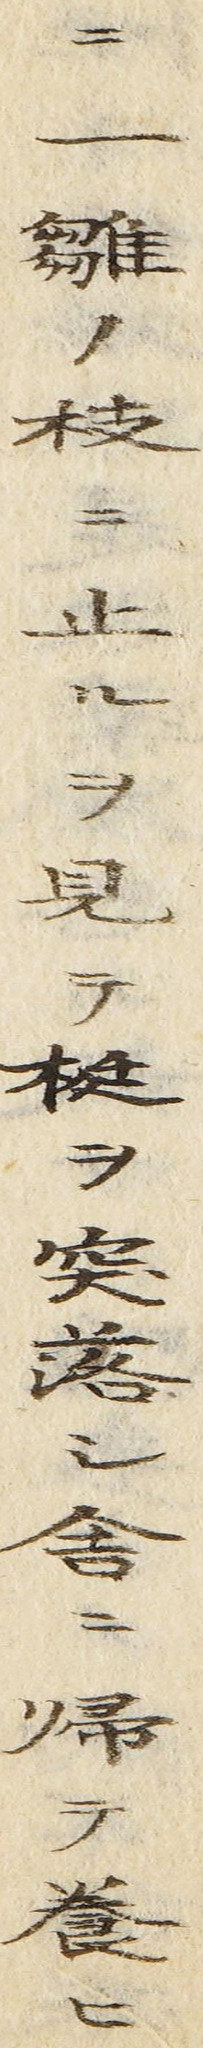ニ一雛ノ枝ニ止ルヲ見テ梃ヲ突落シ舎ニ帰テ養ヒ
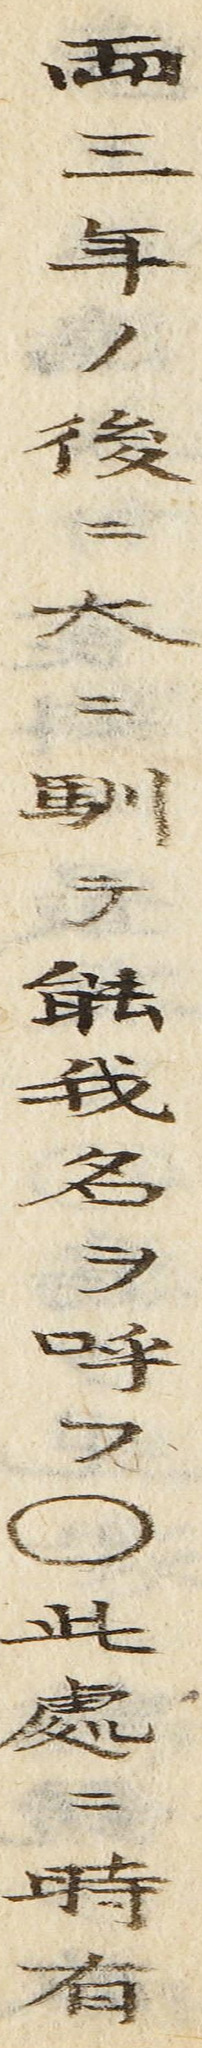両三年ノ後ニ大ニ馴テ能我名ヲ呼フ◯此処ニ時有
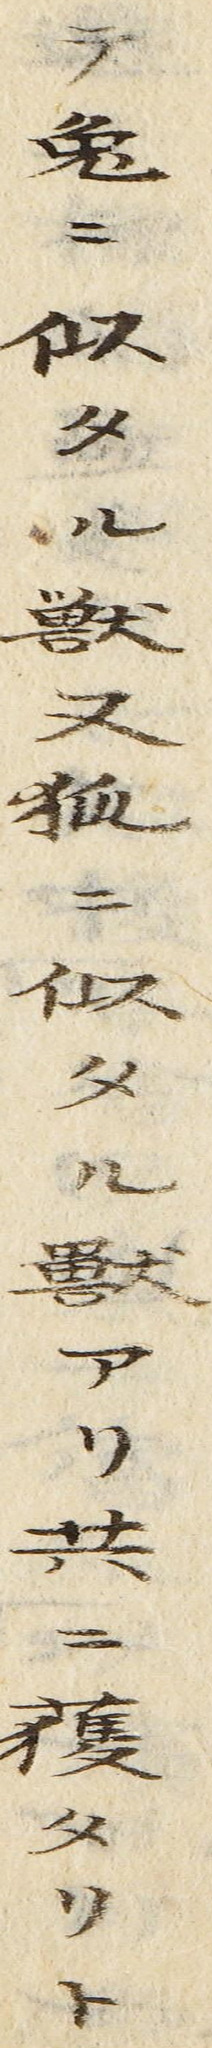テ兎ニ似タル獣又狐ニ似タル獣アリ共ニ獲タリト
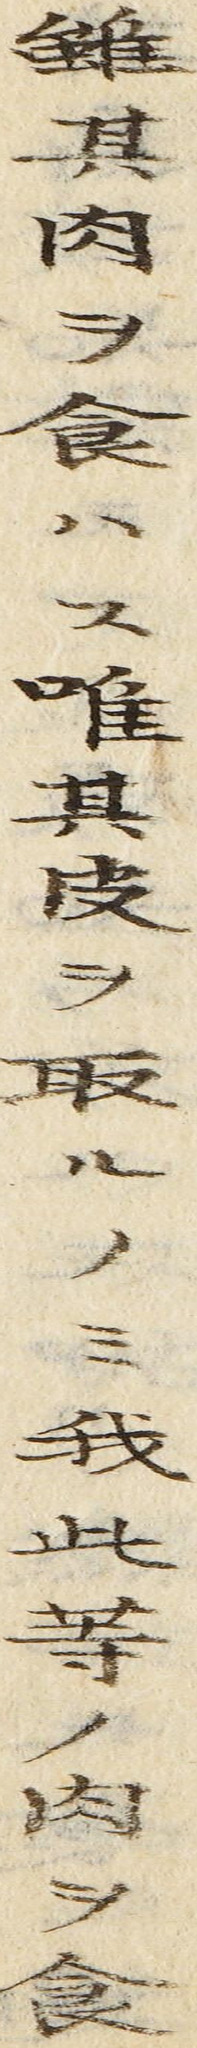雖其肉ヲ食ハス唯其皮ヲ取ルノミ我此等ノ肉ヲ食
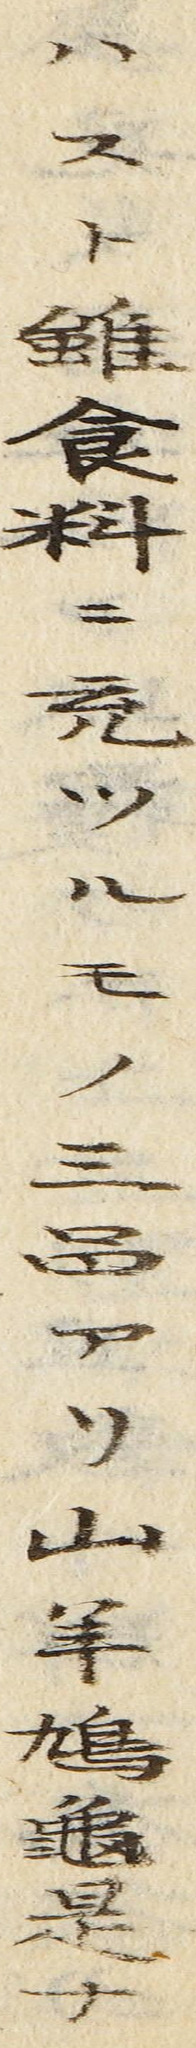ハスト雖食料ニ充ツルモノ三品アリ山羊鳩亀是ナ
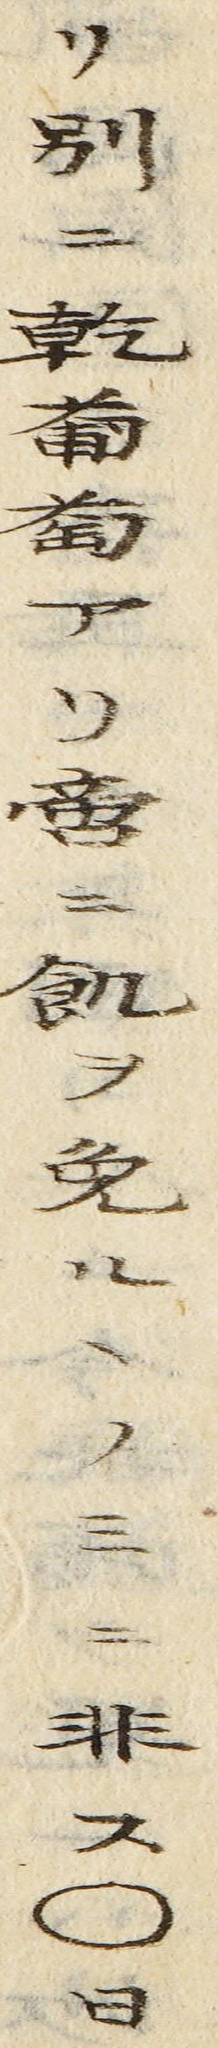リ別ニ乾葡萄アリ啻ニ飢ヲ免ルヽノミニ非ス◯日
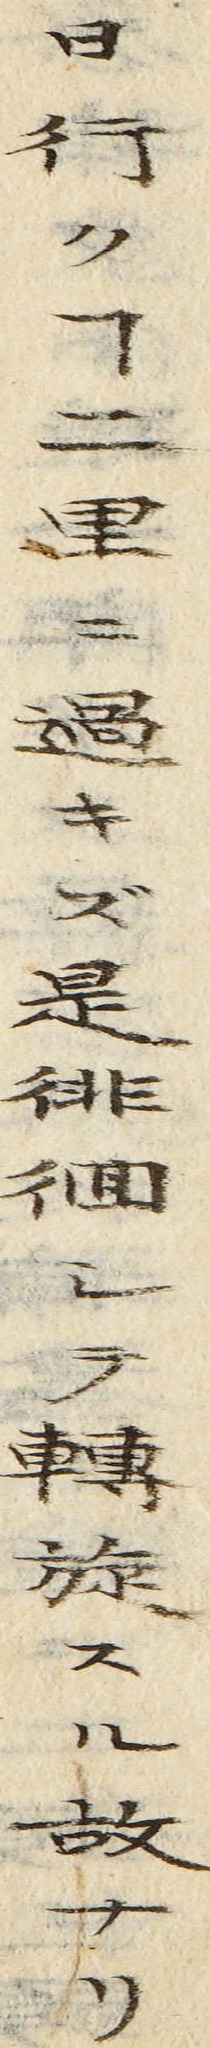日行クコト二里ニ過キズ是徘徊シテ転旋スル故ナリ
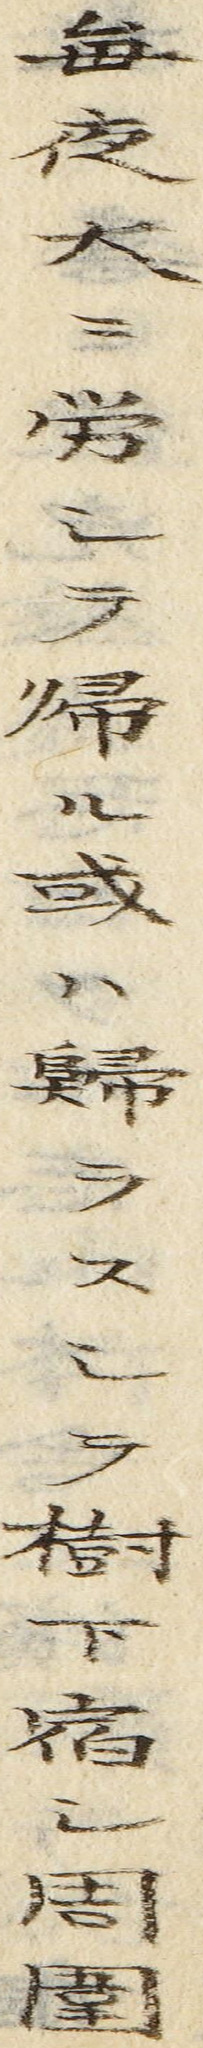毎夜大ニ労シテ帰ル或ハ帰ラスシテ樹下宿シ周囲
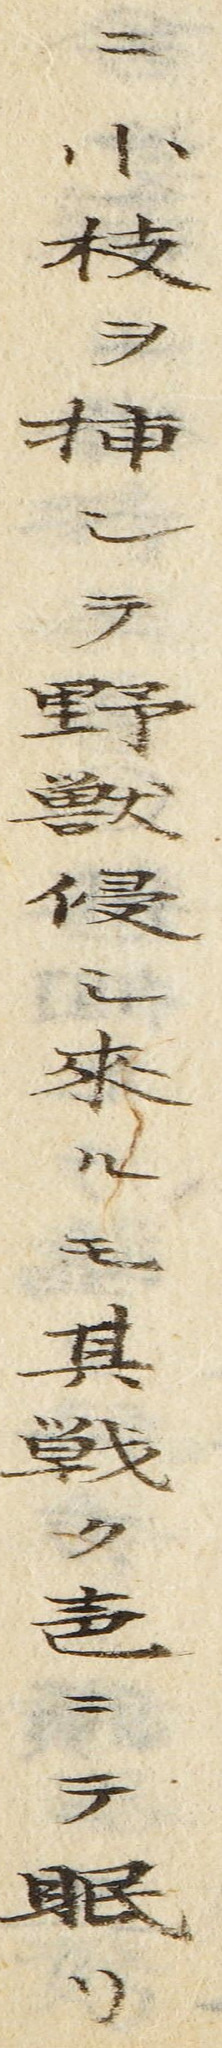ニ小枝ヲ挿シテ野獣侵シ来ルモ其戦ク声ニテ眠リ

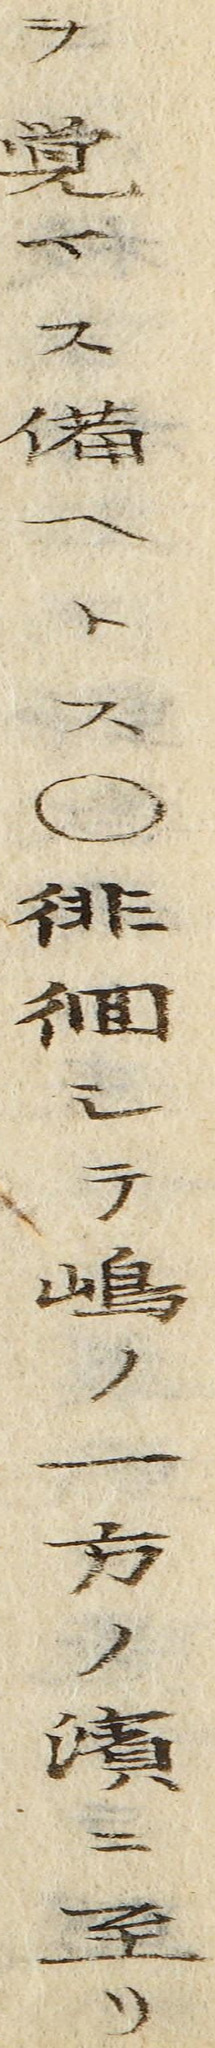ヲ覚マス備ヘトス◯徘徊シテ島ノ一方ノ浜ニ至リ
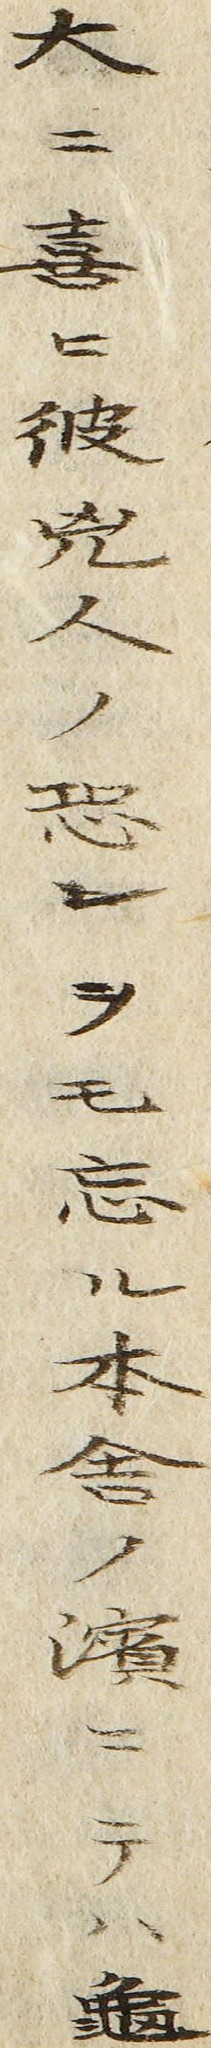大ニ喜ヒ彼兇人ノ恐レヲモ忘ル本舎ノ浜ニテハ亀
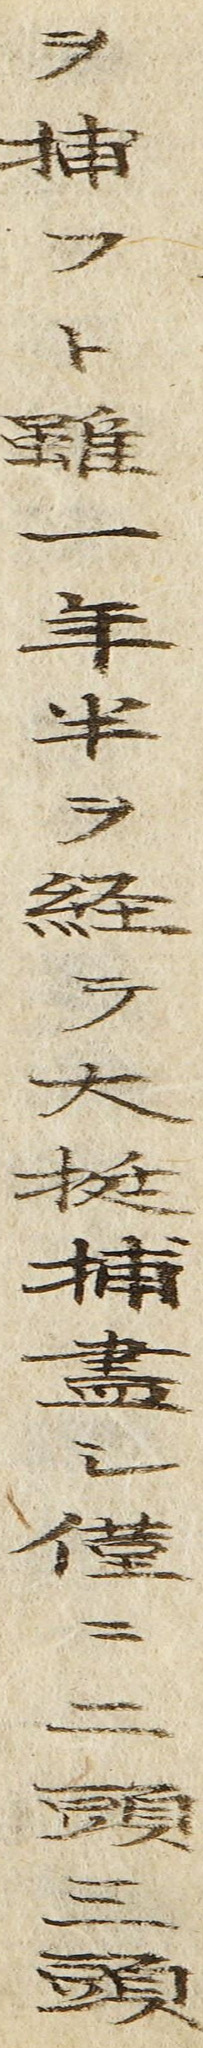ヲ捕フト雖一年半ヲ経テ大挺捕尽シ僅ニ二頭三頭
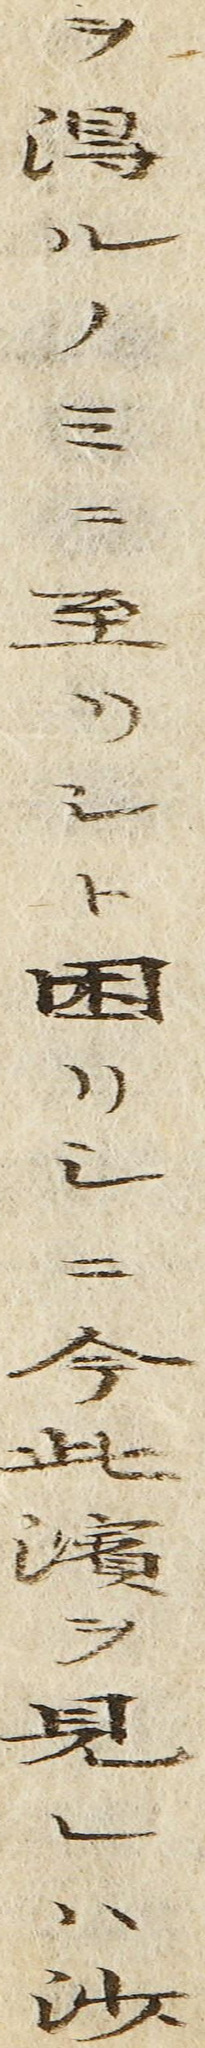ヲ得ルノミニ至リシト困リシニ今此浜ヲ見レハ沙
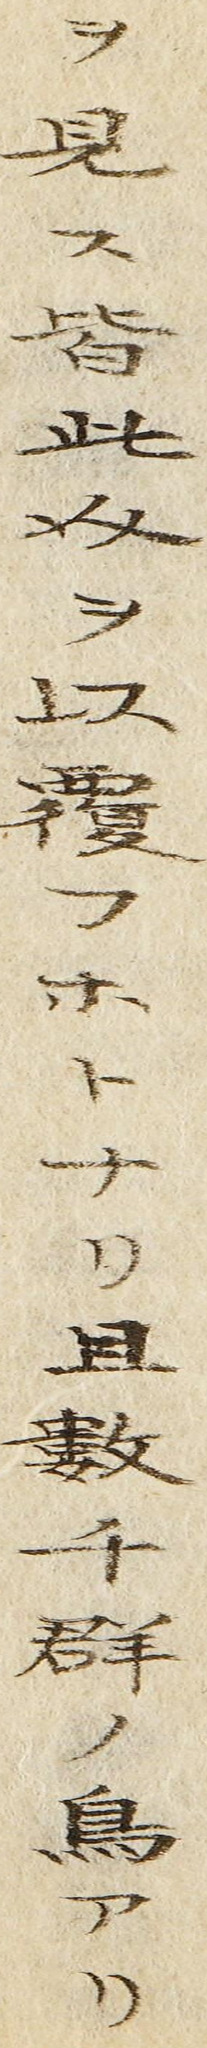ヲ見ス皆此介ヲ以覆フホトナリ且数千群ノ鳥アリ
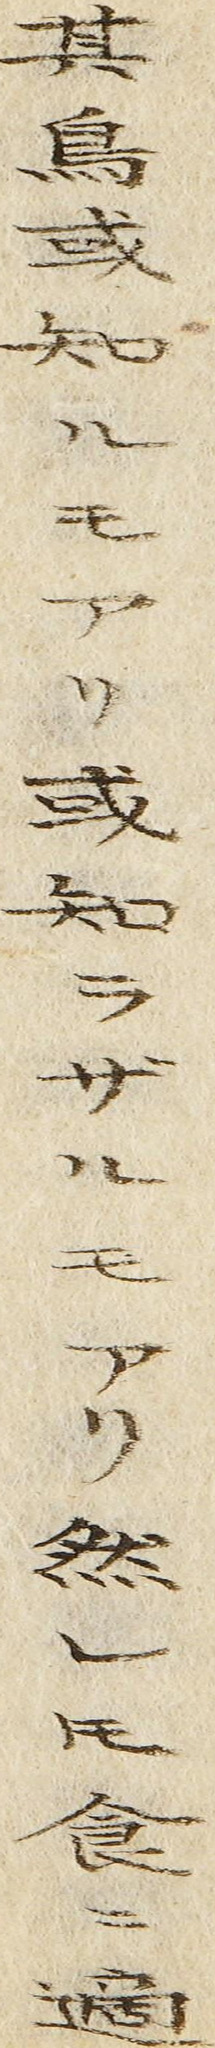其鳥或知ルモアリ或知ラザルモアリ然レトモ食ニ適
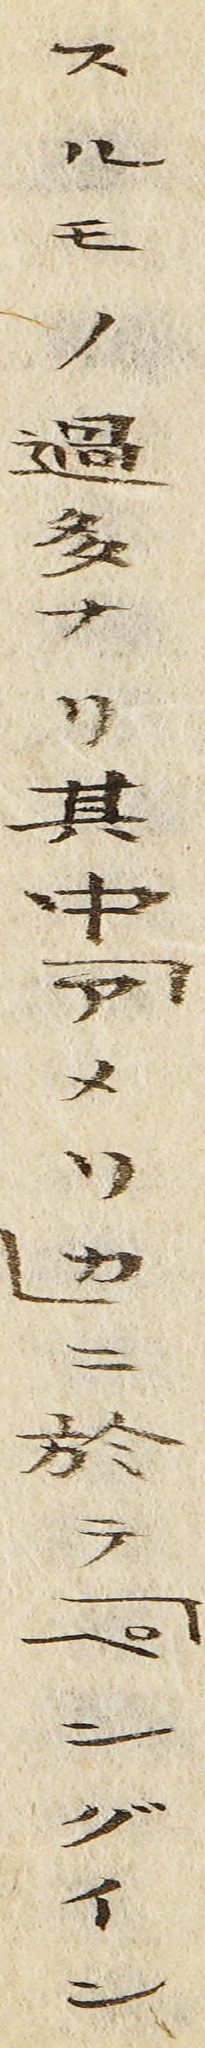スルモノ過多ナリ其中「アメリカ」ニ於テ「ペングイン
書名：漂流紀事
